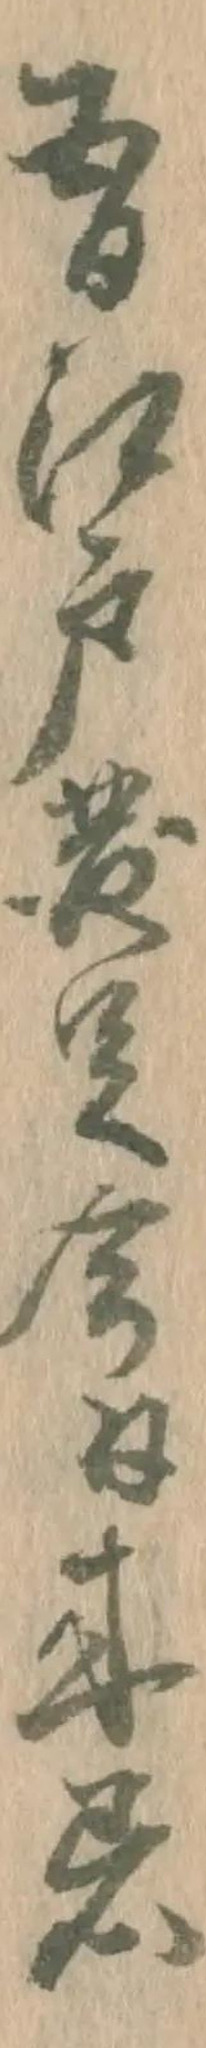五日江戸発足今日来着
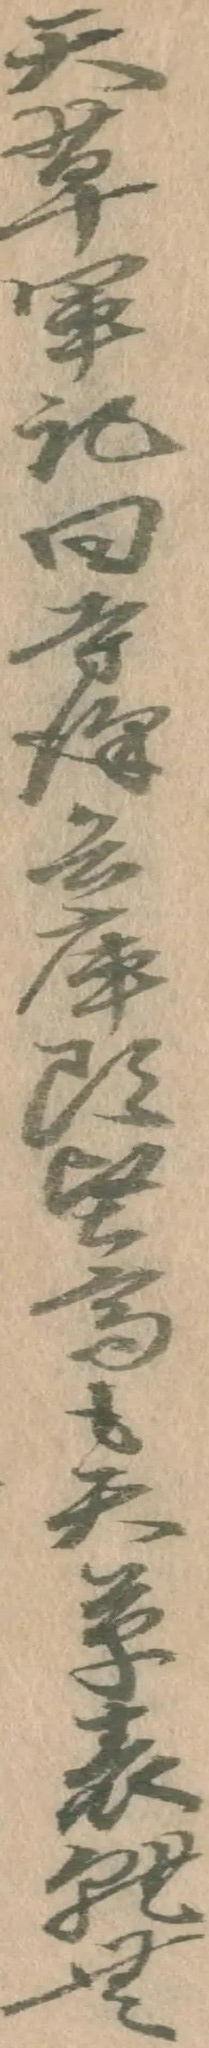天草軍記曰寺沢兵庫頭堅高も天草表就無
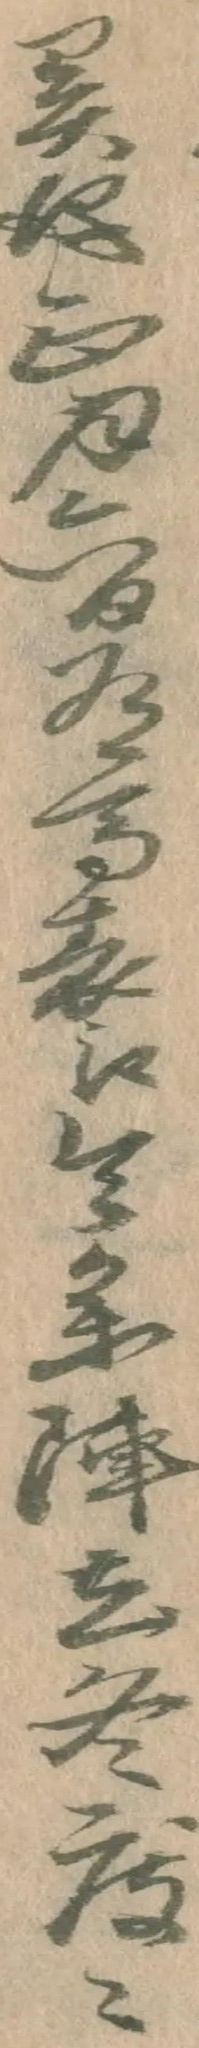異儀正月六日有馬表江令参陣去冬為に
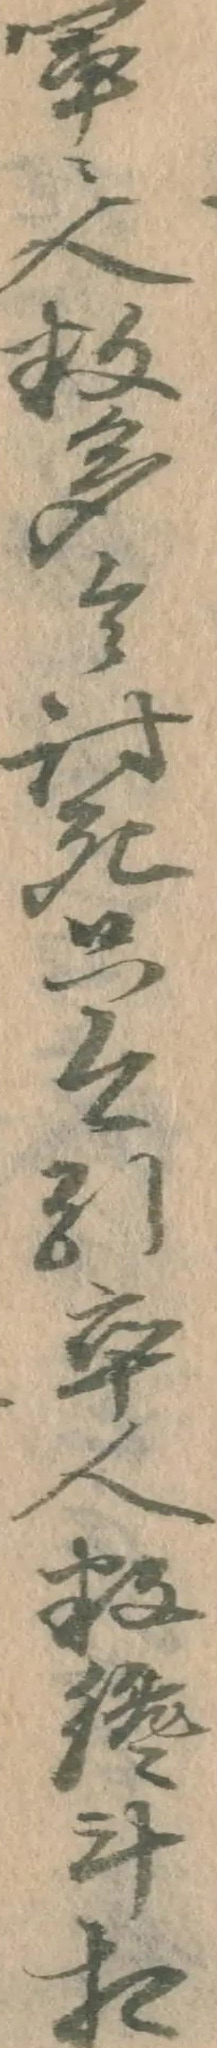軍に人数多令討死只今引卒人数纔斗相
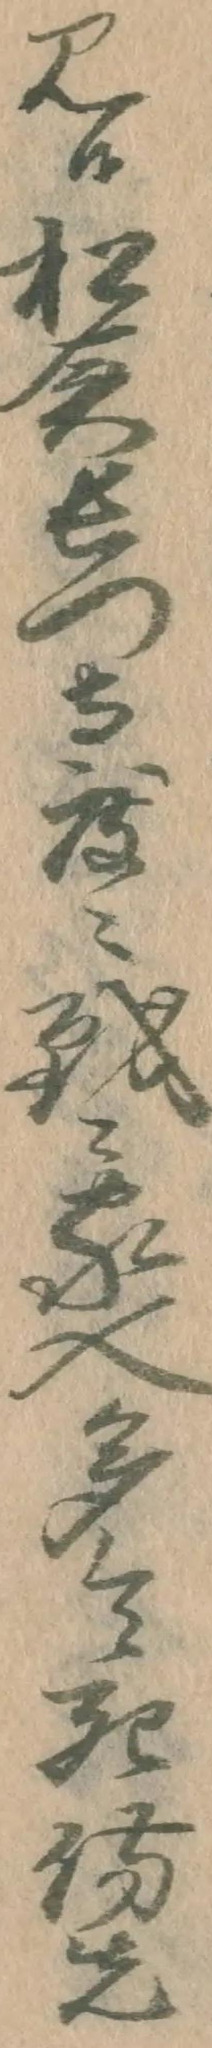見候松倉長門守度々戦に家人多令歟備先
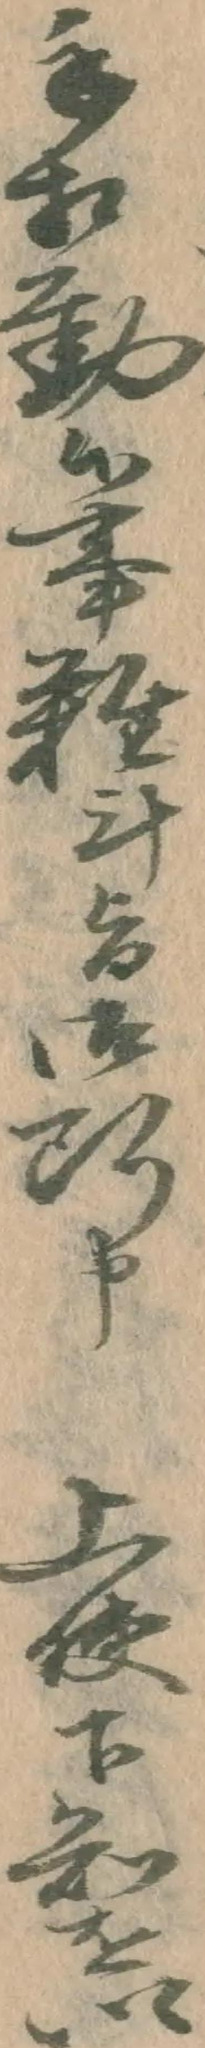手相勤候事難斗旨御断申上使下知を以
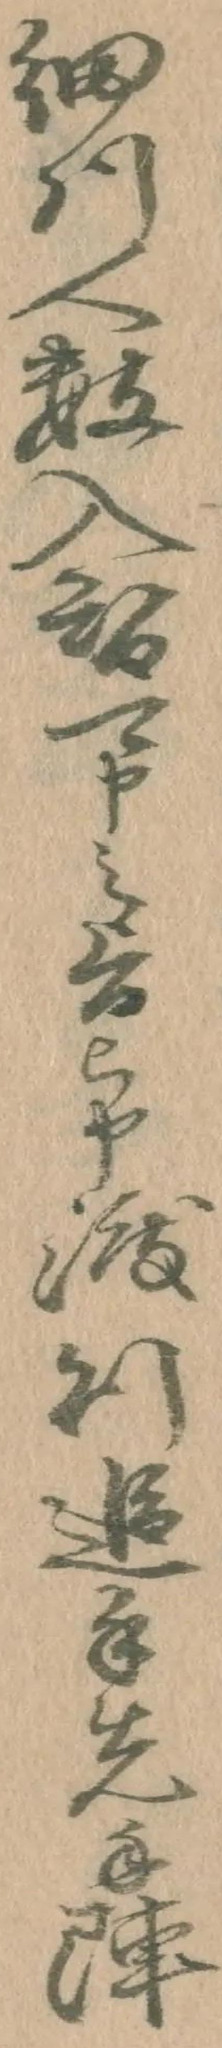細川人数入替可申之旨被申渡則追手先手陣
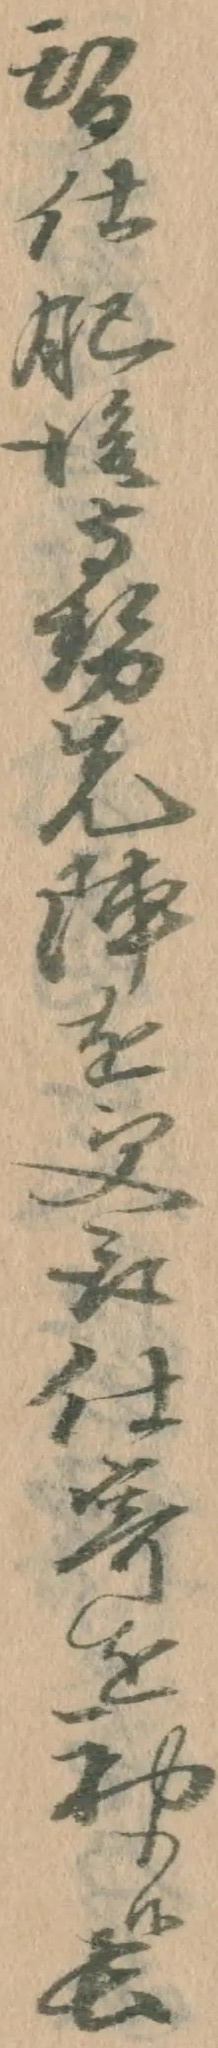替仕肥後守勢先陣を受取仕寄を初り候長
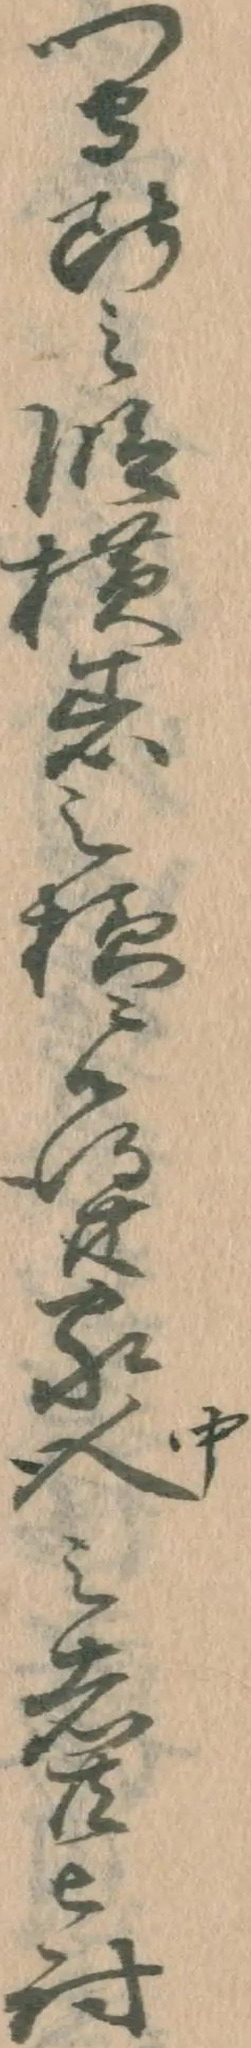門守断之段横着之様に候得共家人之者共被討
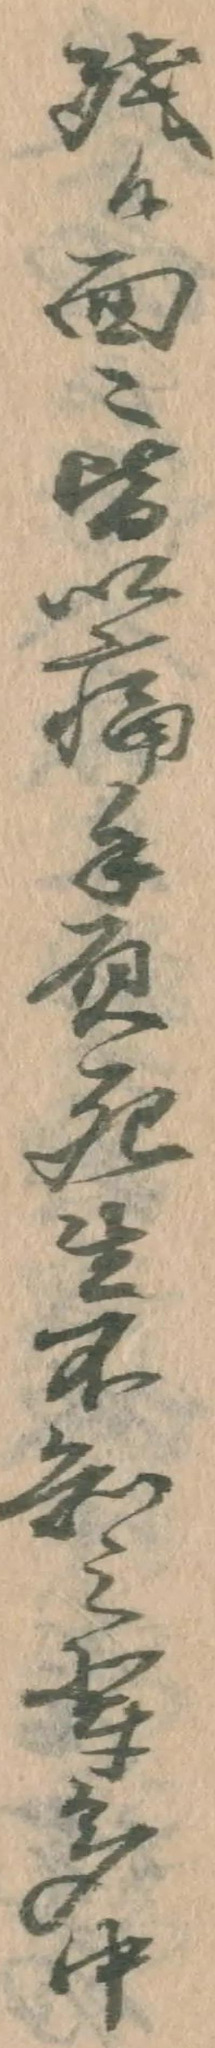残候面々皆以痛手負死生不知之輩多中
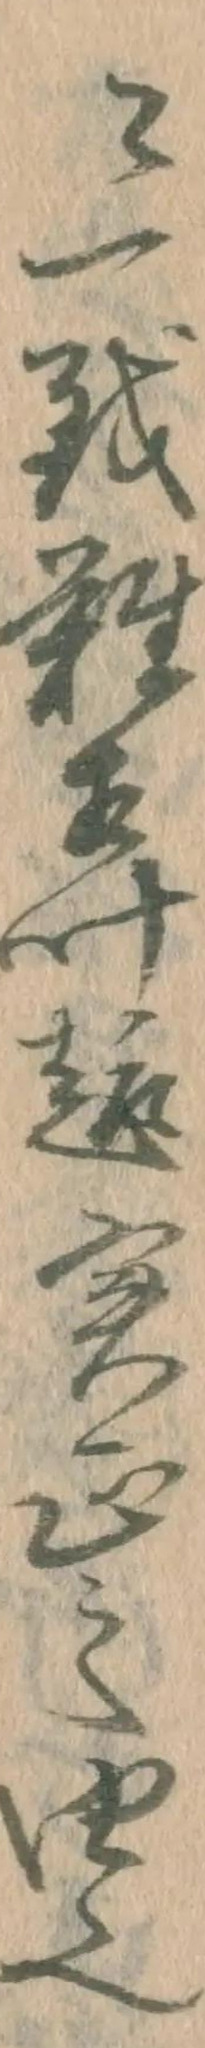々一戦難相叶趣実正之由也
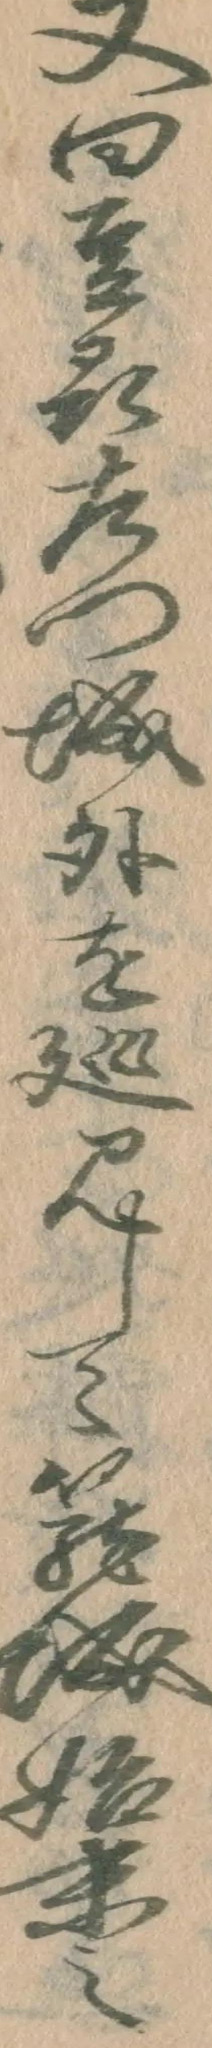又曰豆州左門城外を巡見して籠城始末之
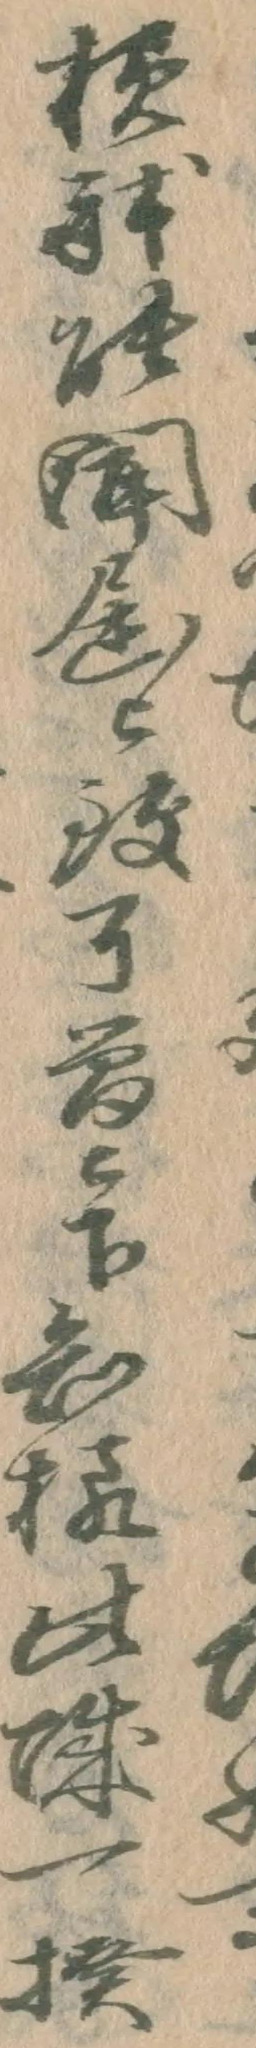様躰能聞届被致了簡被下知様此城一揆
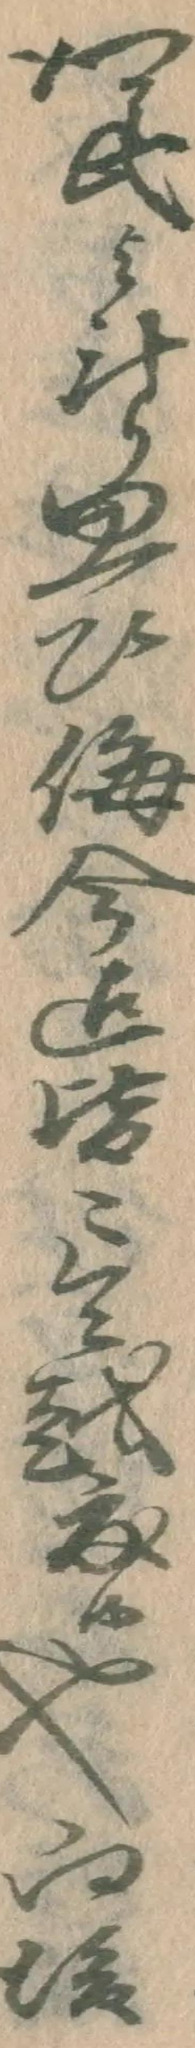如此与斗り思ひ侮今迄皆々令越度候也向後
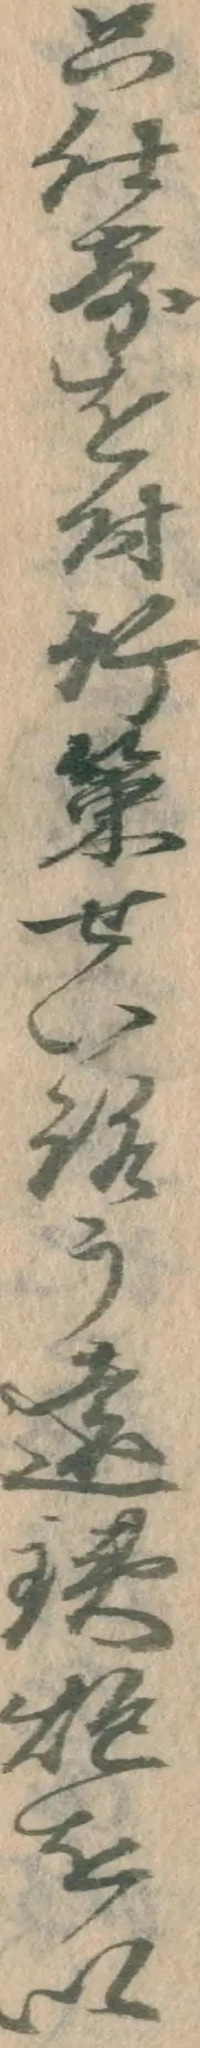只仕寄を付竹策せい路う遠鉄砲を以
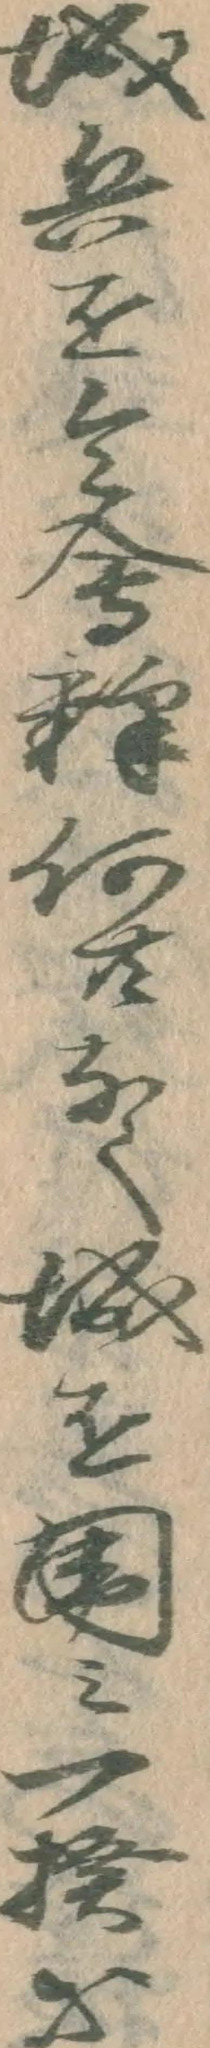城兵を令会釈何共なく城を囲み一揆等
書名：切支丹御退治記 49巻. [5]
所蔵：国立国会図書館 National Diet Library, JAPAN
